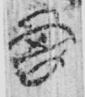言
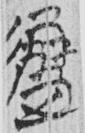○（堋）
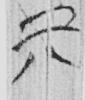亓（其）
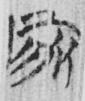所
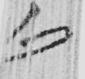㠯（以）
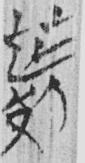○（葬）
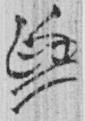爲
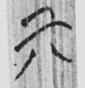亓
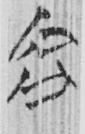容
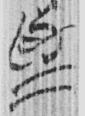爲
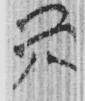亓
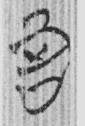言
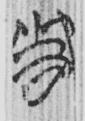周
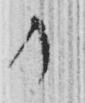人
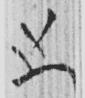之
